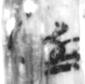爲
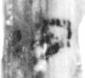日
